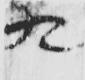九
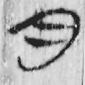月
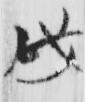戊
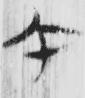午
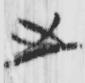之
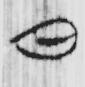日
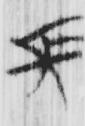長
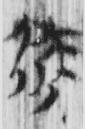○（沙）
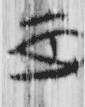正
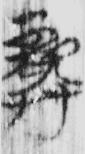龔
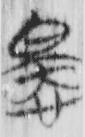懌
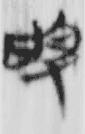受
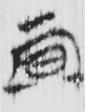○（期）
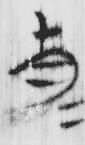十月
